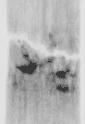{卅二}
